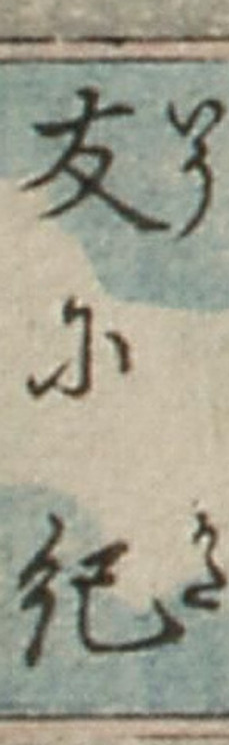友に紀
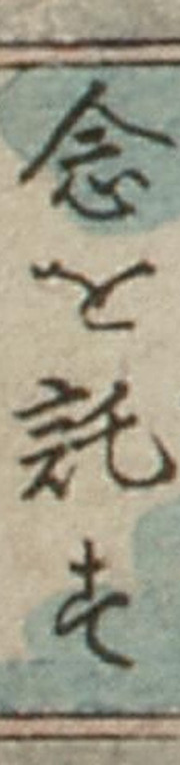念を託す

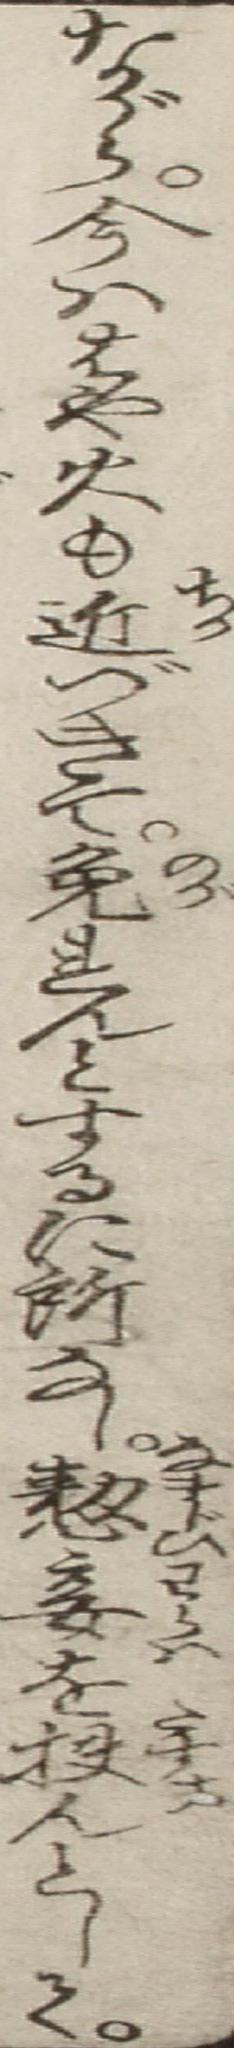ながら。今ははや火も近づきて。免れんとするに所なし。憖妾を扶んとして。
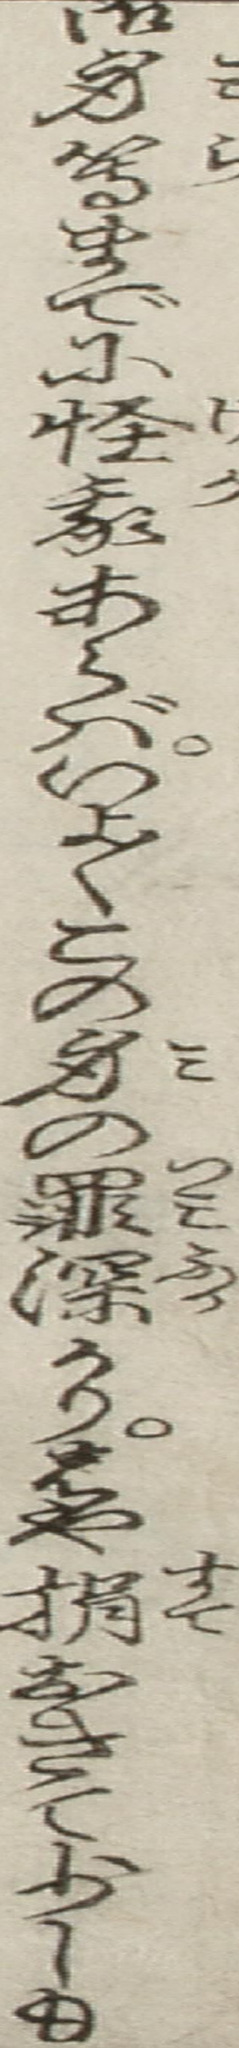御身等までに怪我あらば。いよ〳〵この身の罪深かり。はや捐おきて少しも
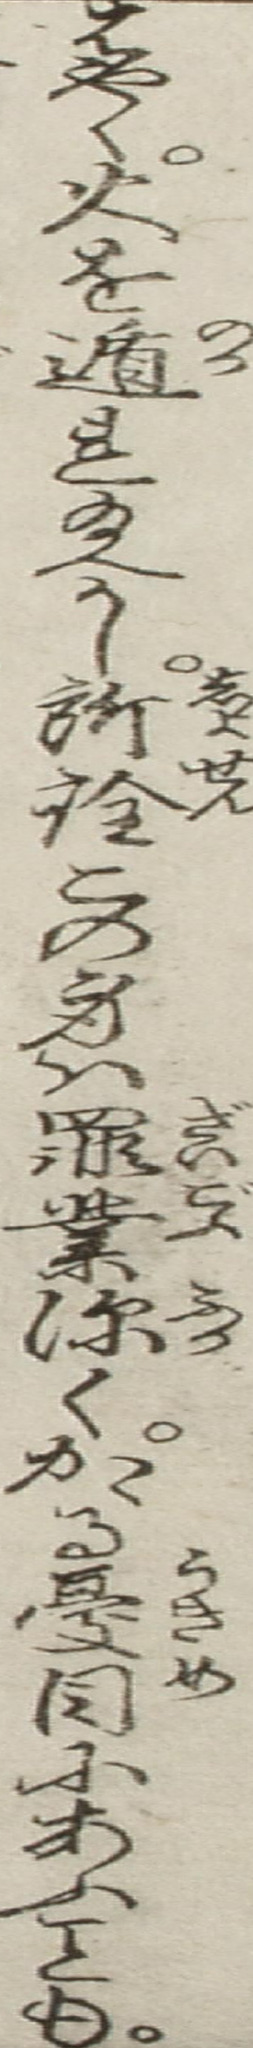はやく。火を遁れ給へかし。所詮この身は罪業深く。かゝる憂目にあふとも。
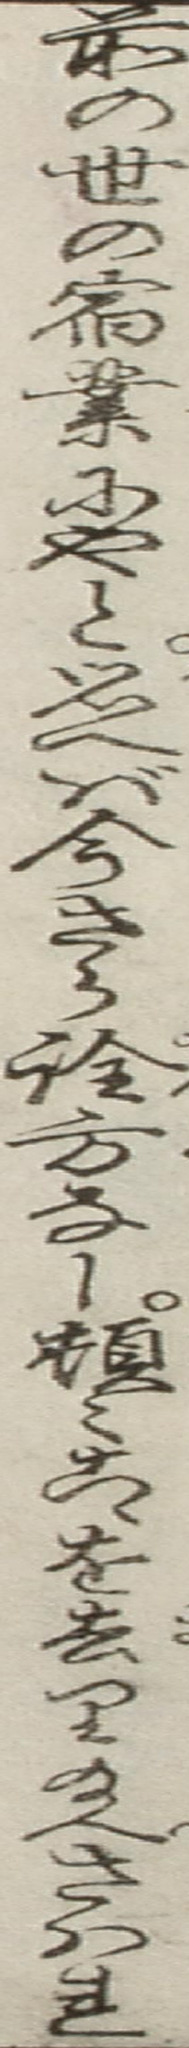前の世の宿業にやと。思へば今さら詮方なし。頓〻こゝを去り給へ。さはれ
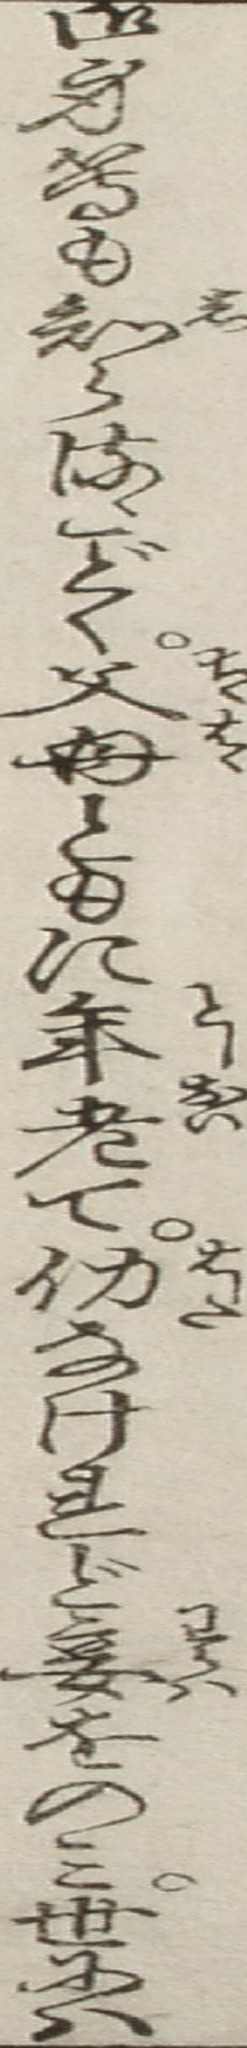御身等も知らるゝごとく。父母ともに年老て。仂なけれど妾をのみ。世には
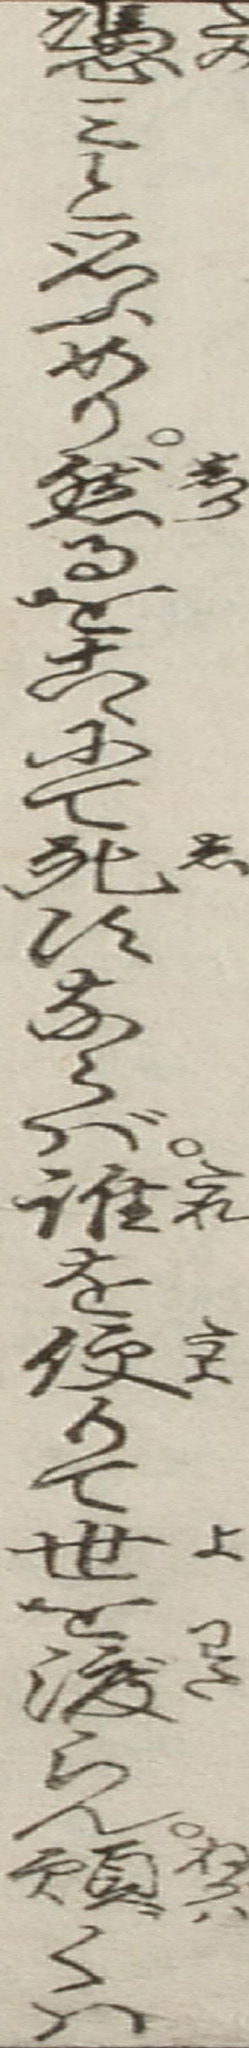憑みと思ふめり。然るをこゝにて死すならば。誰を便りて世を渡らん。願くは
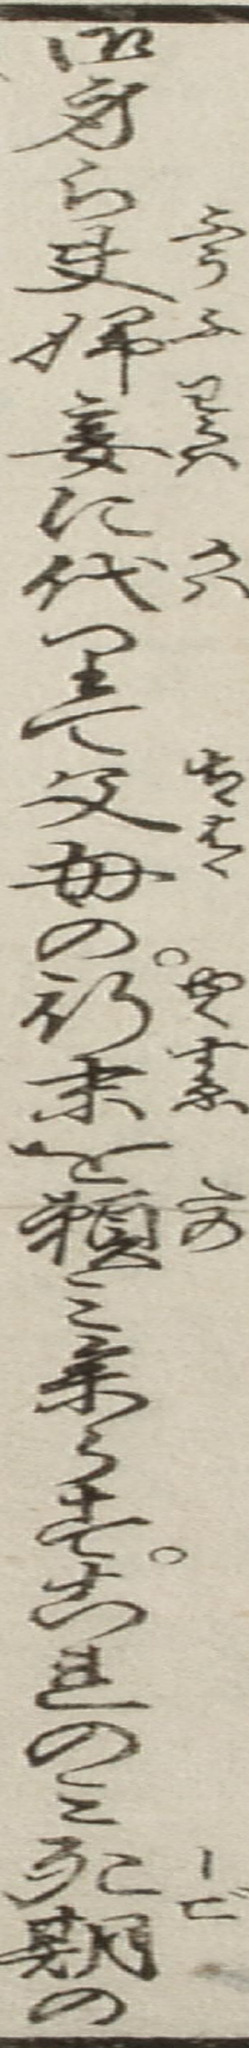御身ら夫婦妾に代りて父母の。行末を頼み参らす。これのみ死期の
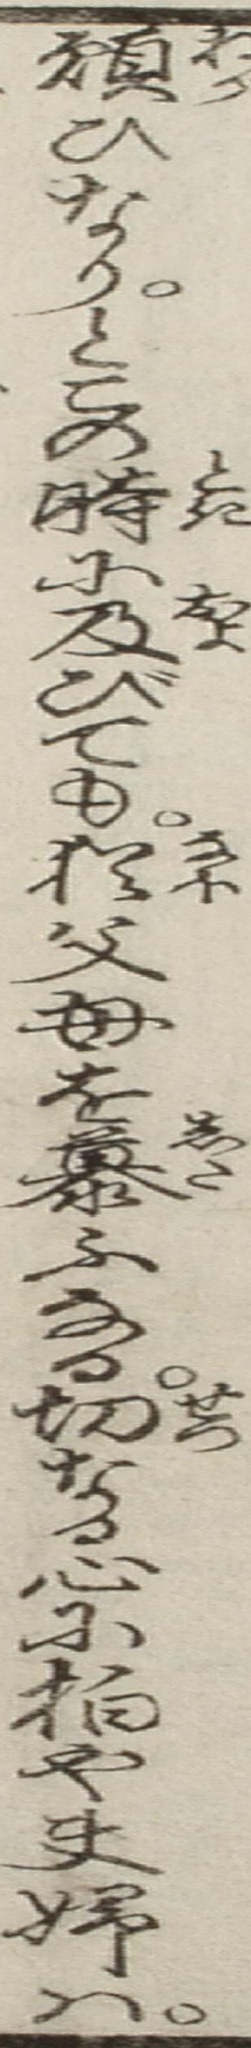願ひなり。とこの時に及びても。猶父母を慕ふなる。切なる心に柏や夫婦は。
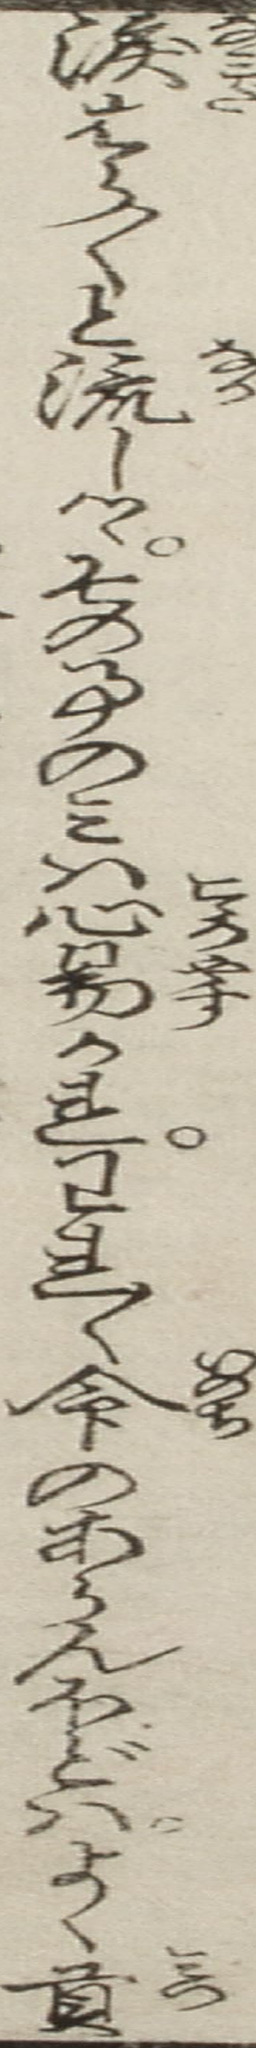涙はら〳〵と流しつゝ。その事のみは心易かれ。われ〳〵命のあらんほどは。よく貢
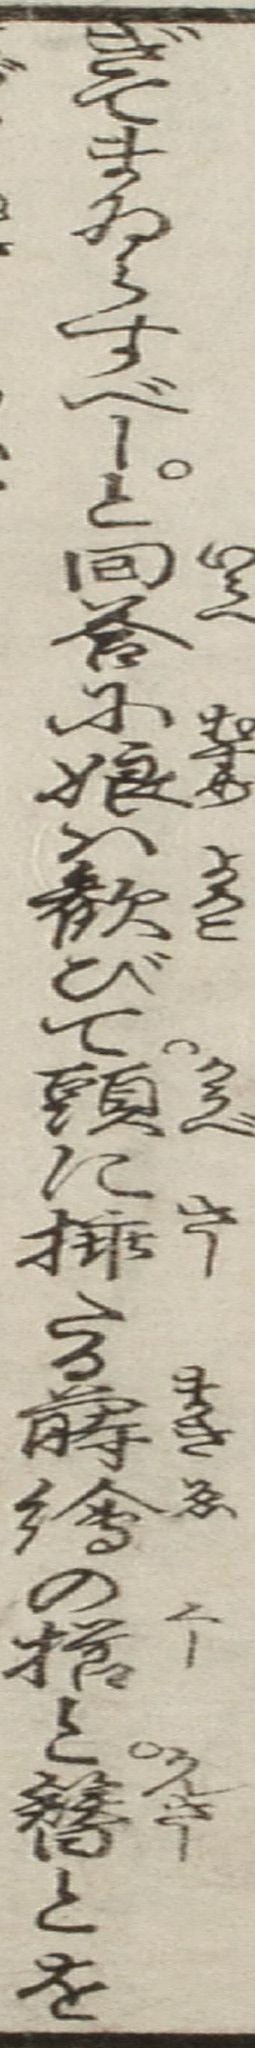ぎてまゐらすべし。と回答に娘は歓びて。頭に挿たる蒔絵の櫛と。簪とを
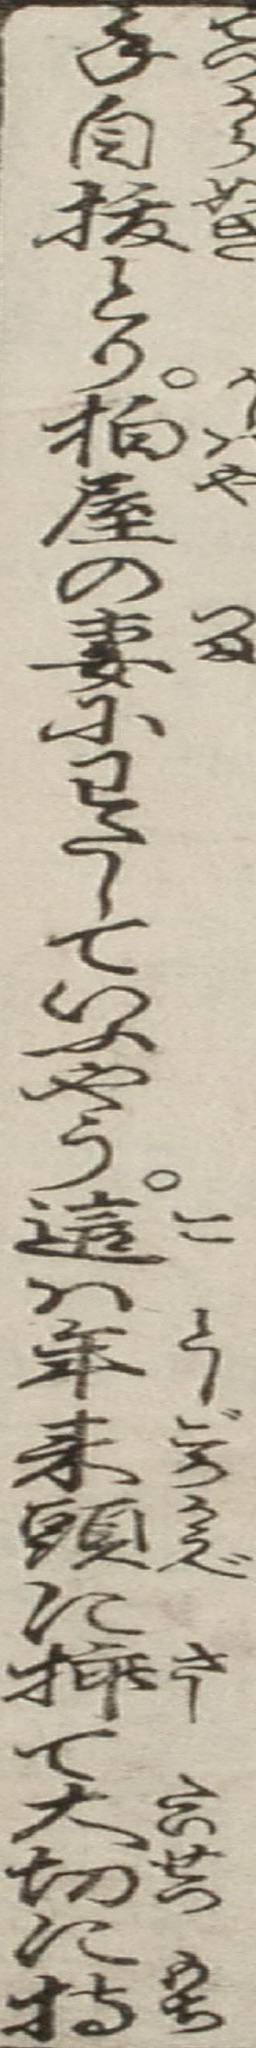手自抜とり。柏屋の妻にわたしていふやう。這は年来頭に挿て大切に持
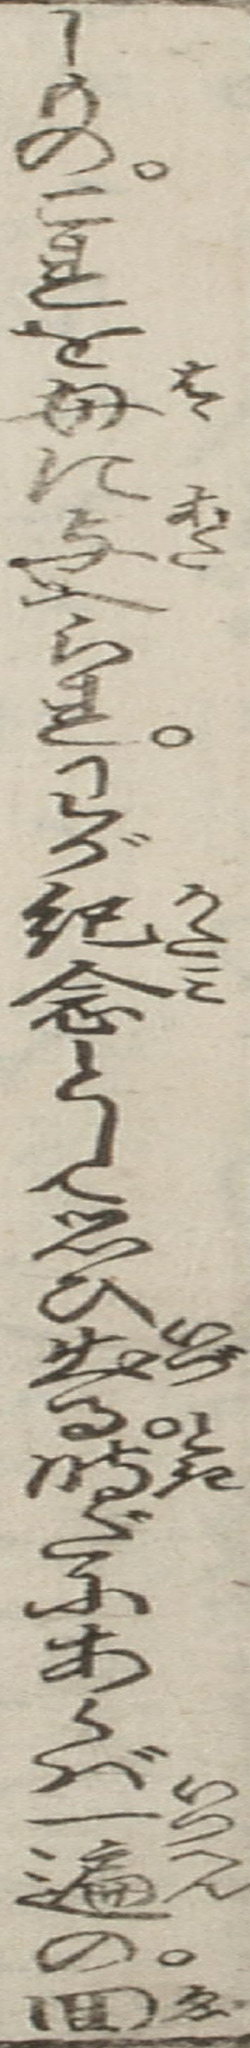しもの。これを母に与へられ。わが紀念として思ひ出る。時だにあらば一遍の。回
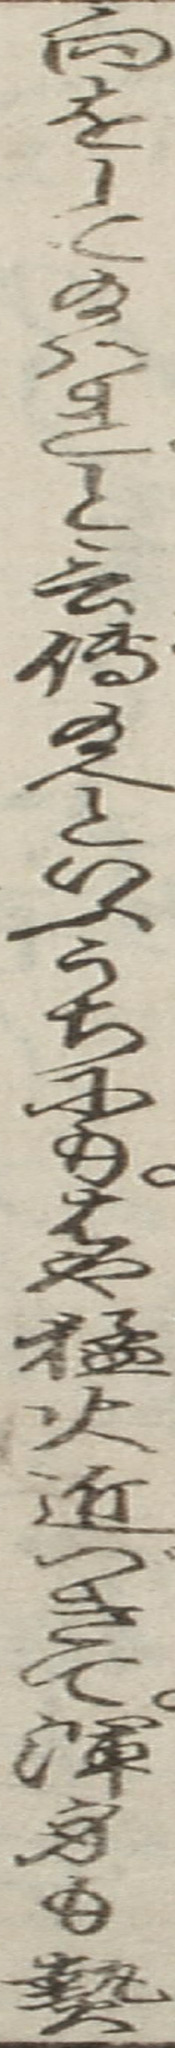向をして給はれ。と言傳給へといふうちにも。はや猛火近づきて。渾身も熱
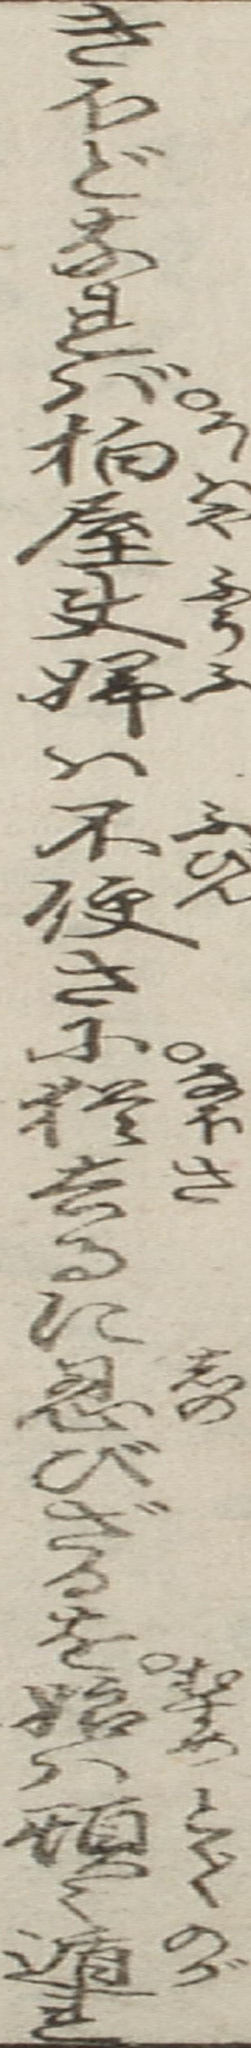きほどなれば。柏屋夫婦は不便さに。猶去るに忍びざるを。娘は頓〻遁れ
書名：安政見聞録　上
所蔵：東京大学地震研究所図書室 Earthquake Research Institute Library, The University of Tokyo, JAPAN
